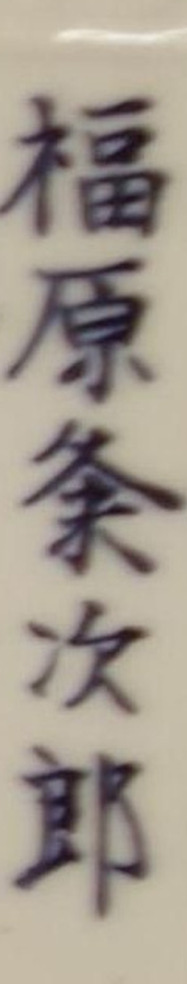福原粂次郎
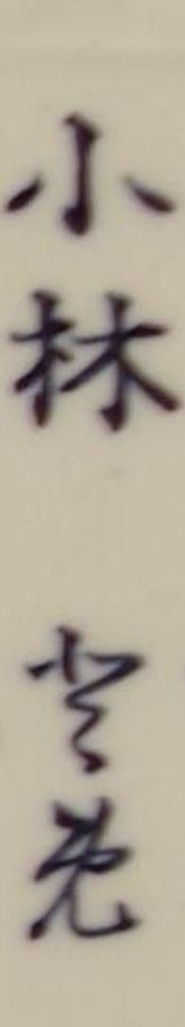小林とめ
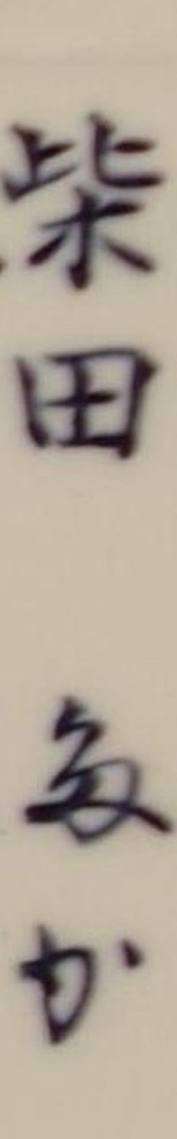柴田たか
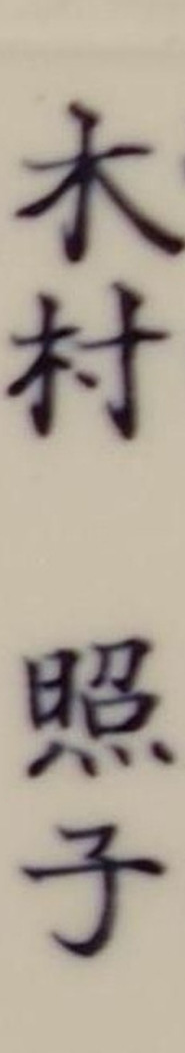木村照子
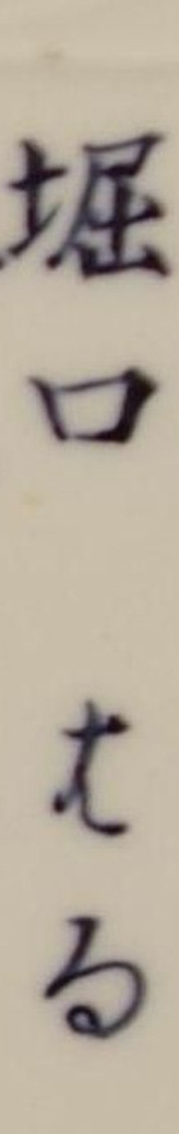堀口はる
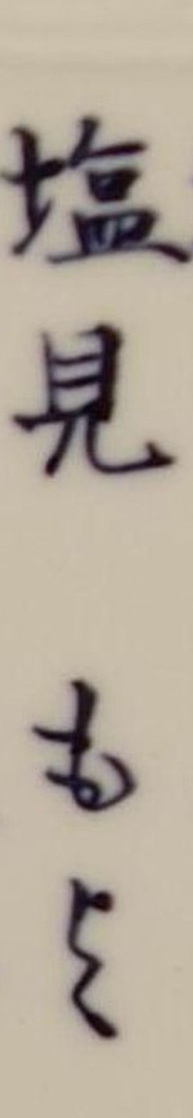塩見もよ
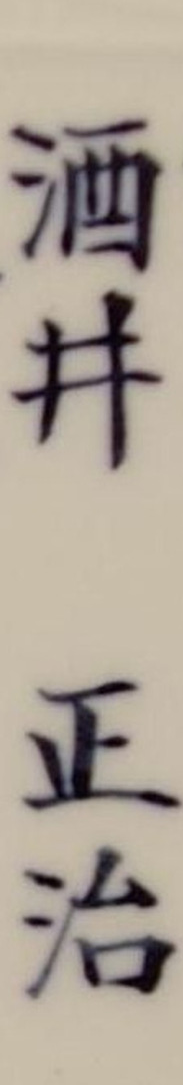酒井正治
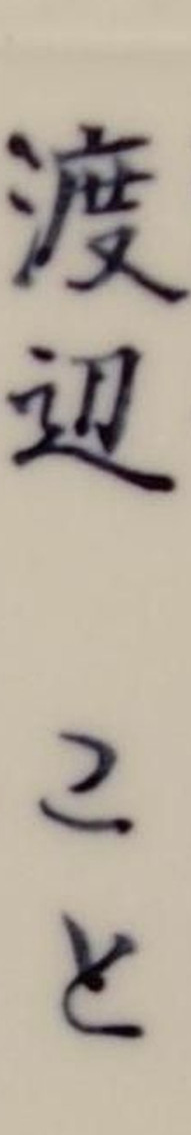渡辺こと
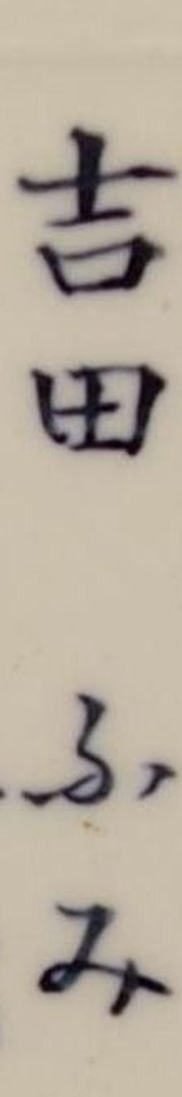吉田ふみ
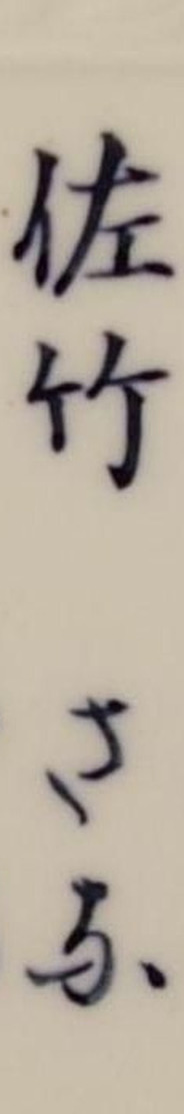佐竹さな
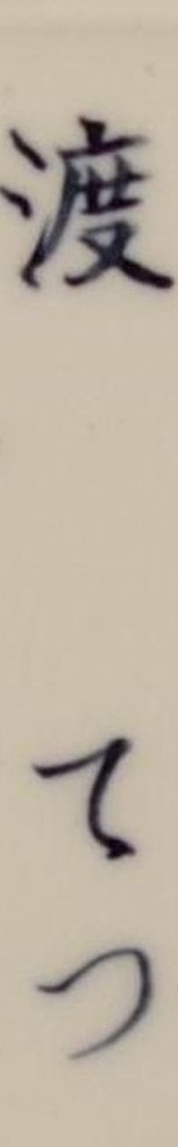渡てつ
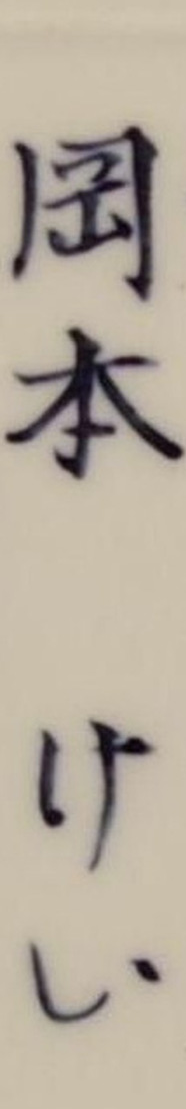岡本けい
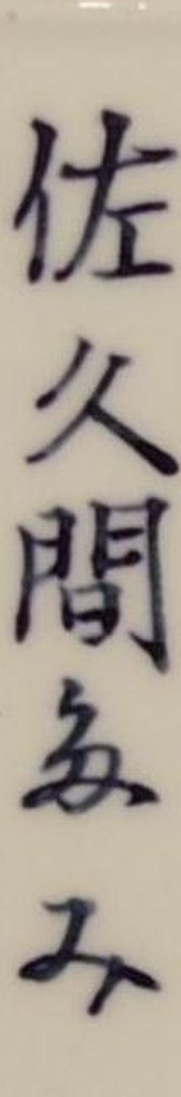佐久間たみ
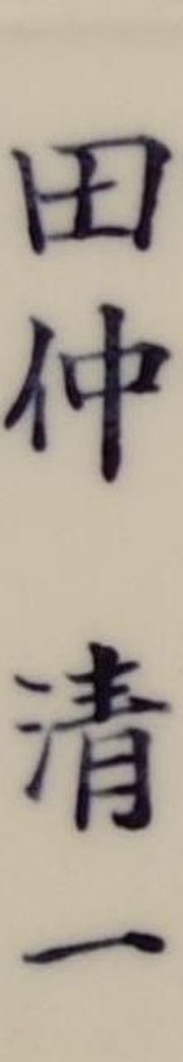田仲清一
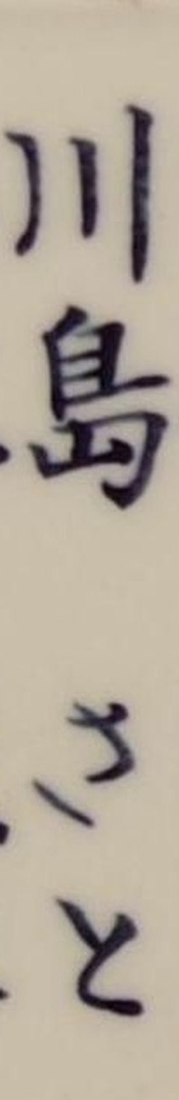川島さと
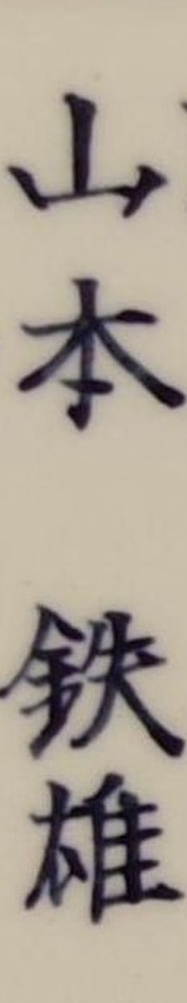山本鉄雄
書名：M~S
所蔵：高野山金剛峯寺
